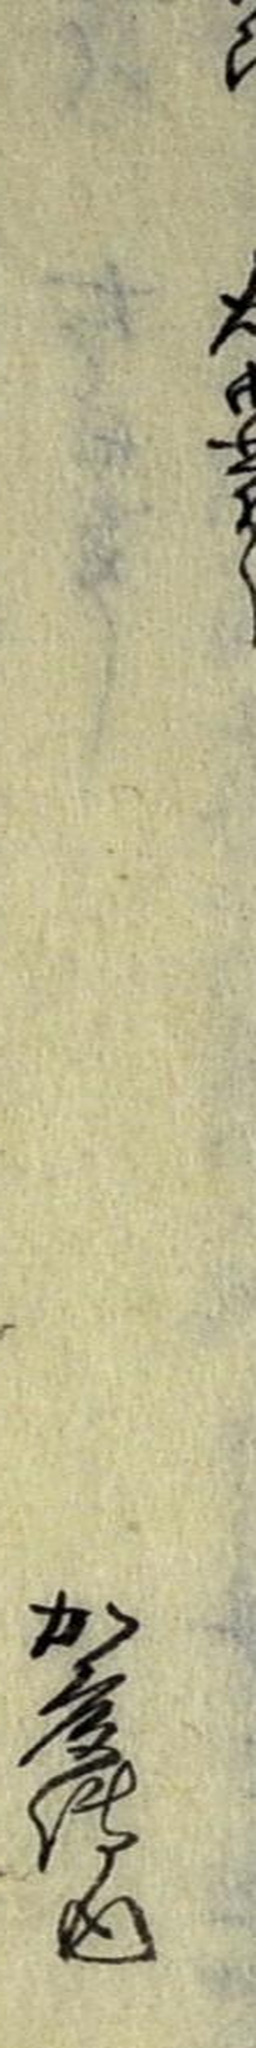加藤伝内
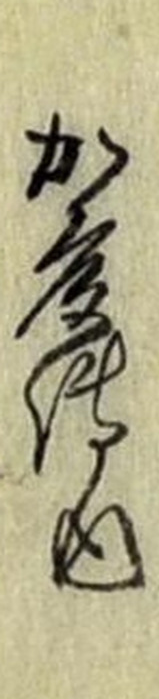加藤伝内
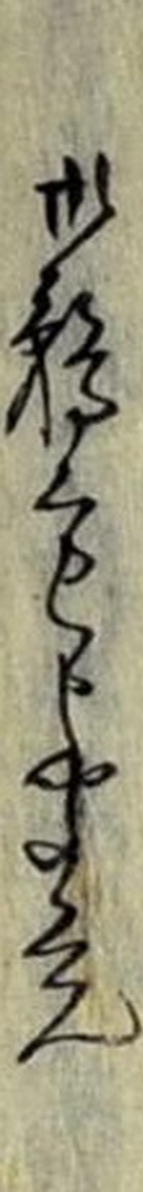御鵜方へ申聞覚
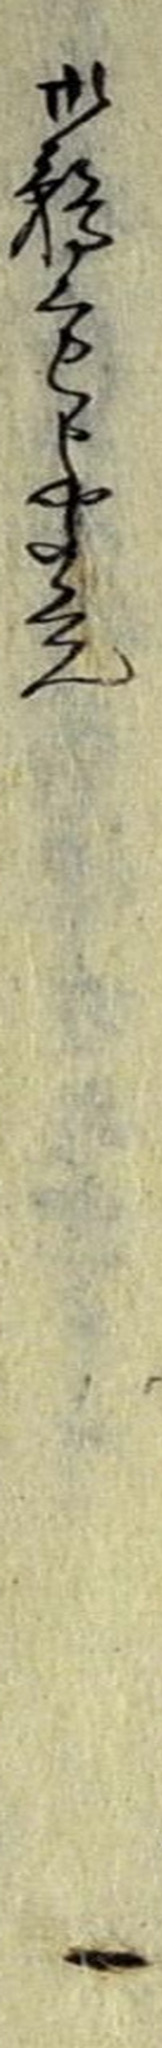御鵜方へ申聞覚
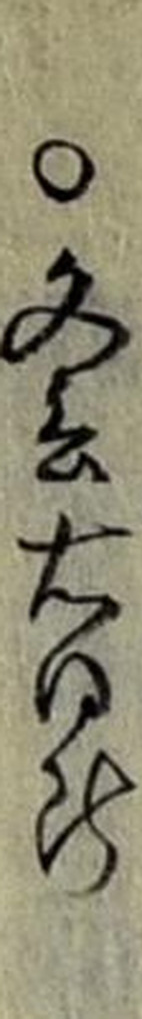〇文言右同断
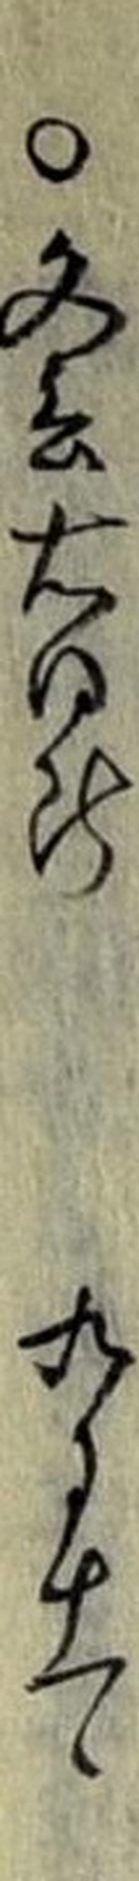〇文言右同断九月十一日
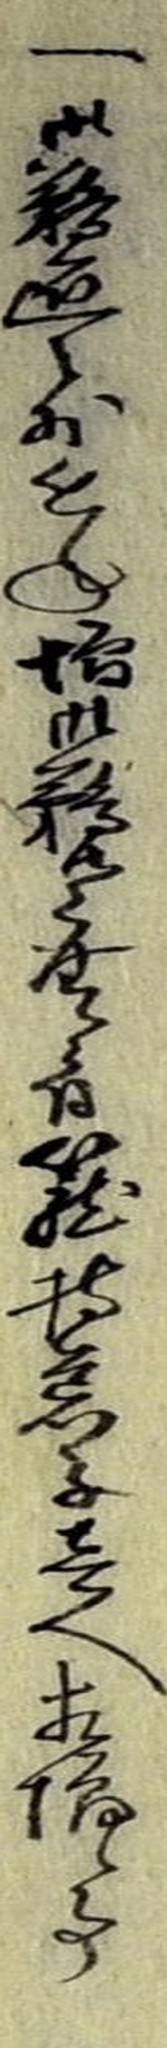一御鵜匠之外近年増御鵜御雇候ニ付籠持荒子壱人相増候事
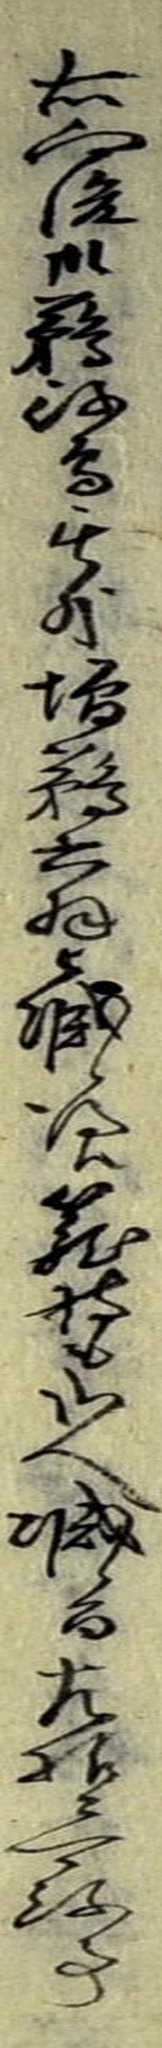右向後御鵜役鳥其外増鵜六羽被減候得ハ籠持も弐人減候間左様ニ可致事
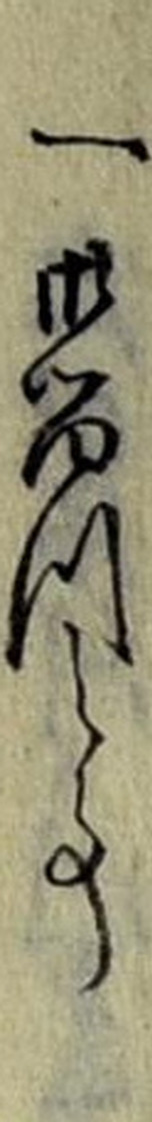一御留川之事

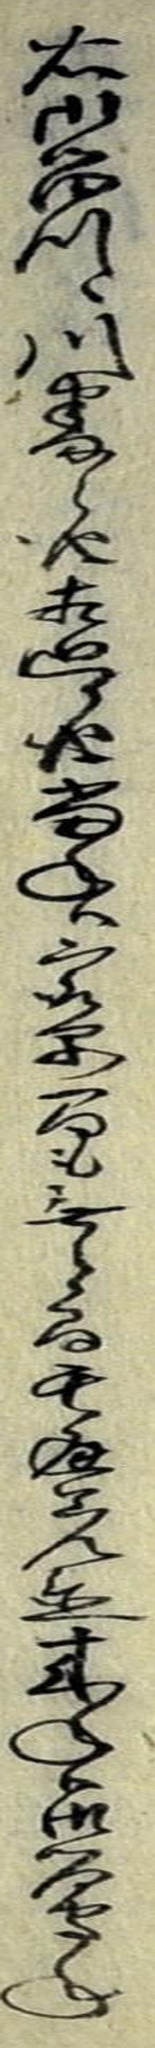右御留川へ川番之儀相廻候儀当年ハ最早間も無之候間其通差置来年ハ御留守年
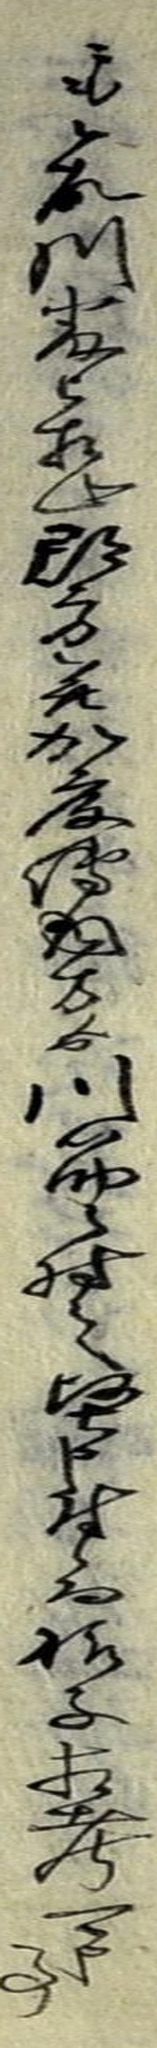ニも候故川番被相止郡方并加藤伝内方ゟ川筋之村々へ堅申付候而様子相考可申事
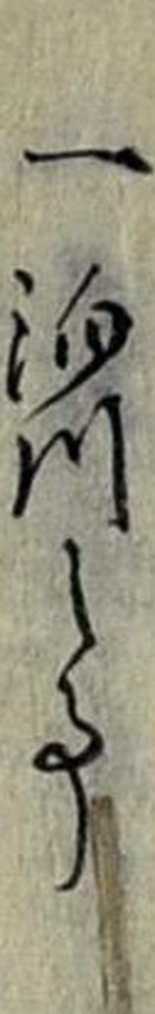一泊川之事
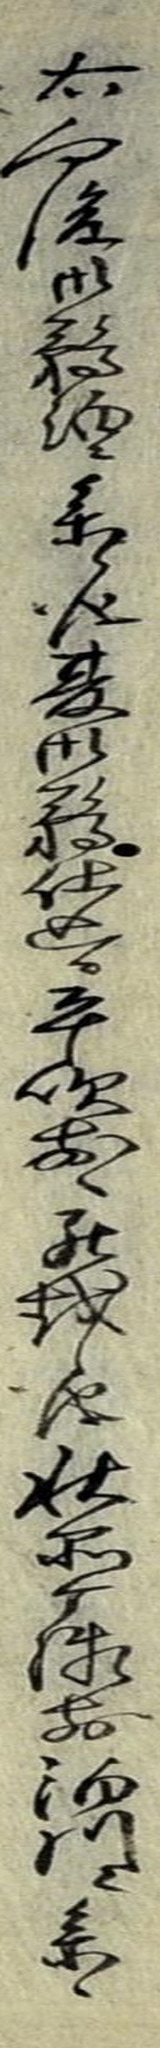右向後御鵜泊ニ参候儀夏御鵜仕込日平吹前へ罷越候儀秋品ケ瀬前泊川ニ参候
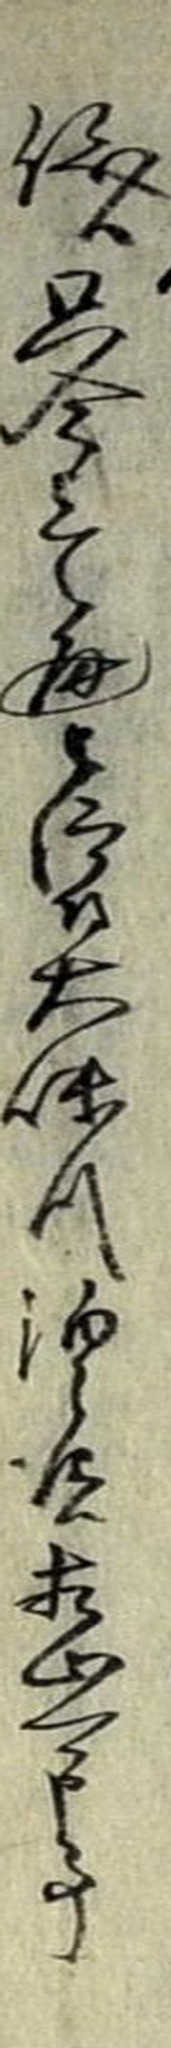儀ハ只今迄之通被仰付大味川泊之儀ハ相止可申事
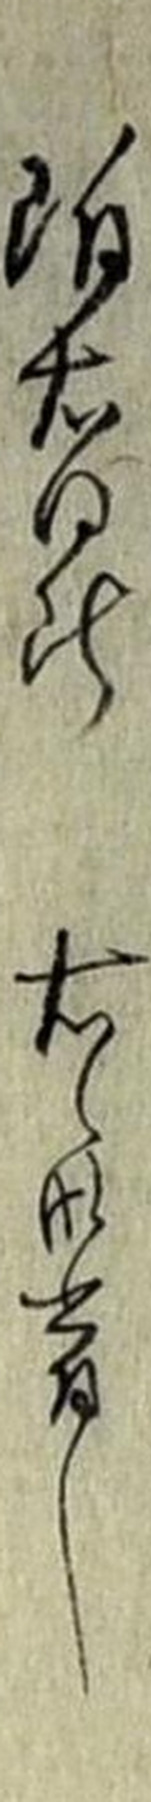附右同断右之御書付之
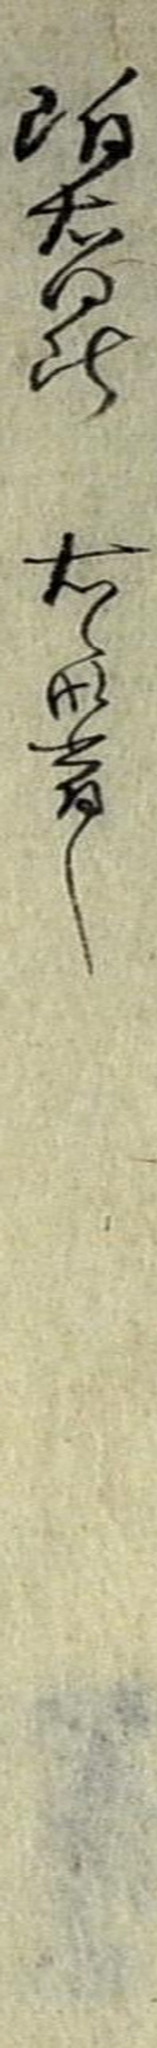附右同断右之御書付之
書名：命令之部 一
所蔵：福井県文書館 Fukui Prefectural Archives
